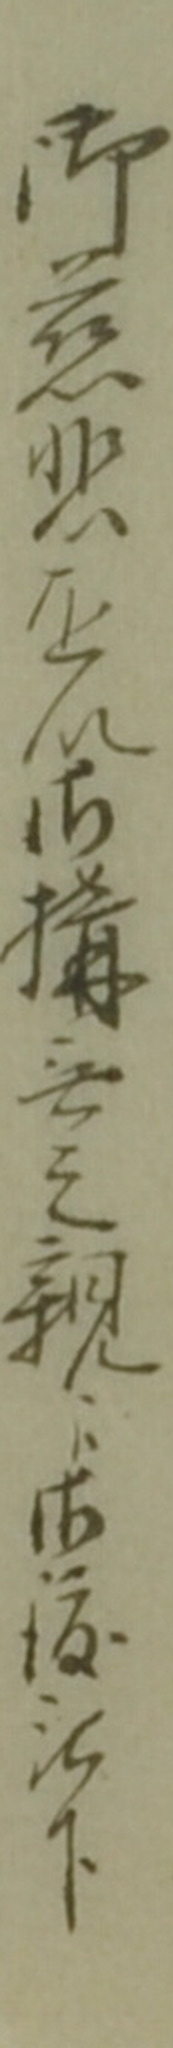御慈悲を以御構無之親江御渡被下
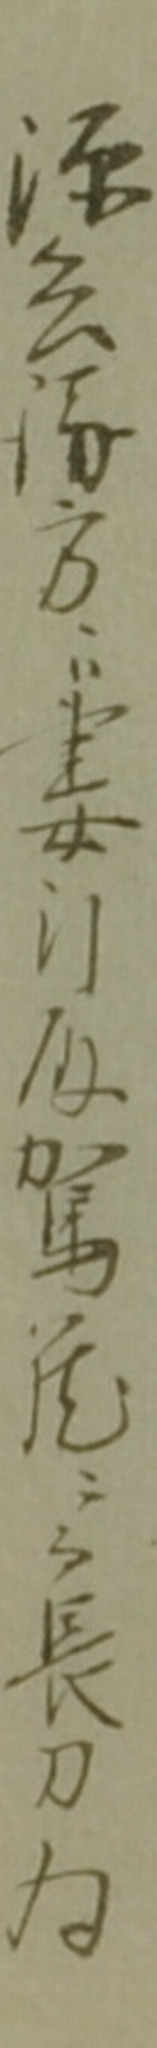源兵衛方江妻引取駕籠ニ而長刀為
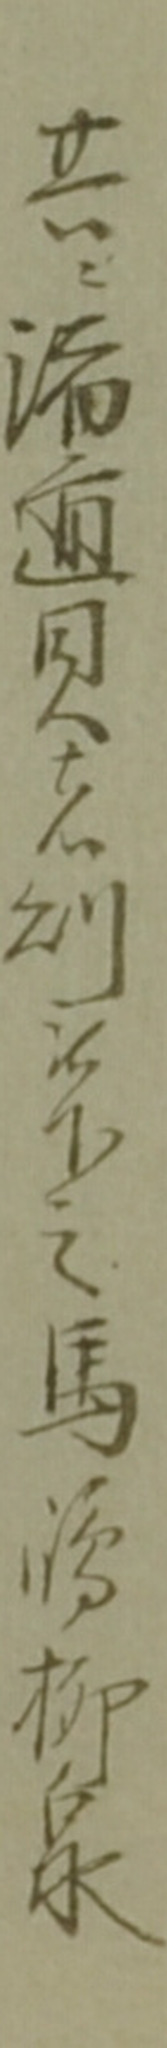共諸道具者則被下之馬嶋柳泉
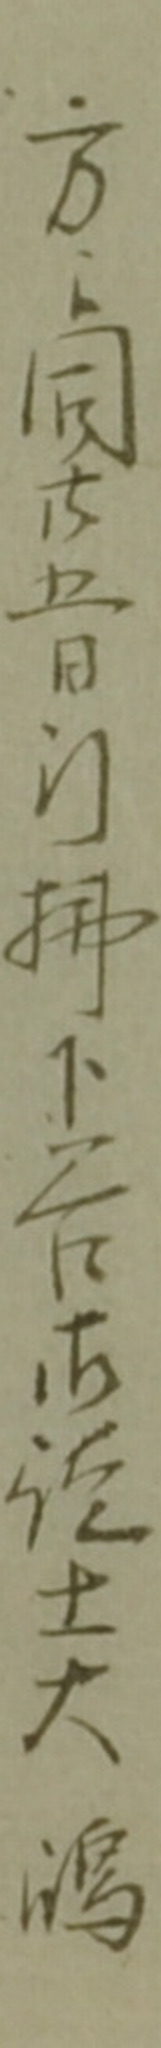方江同廿五日引払下善御徒士大嶋
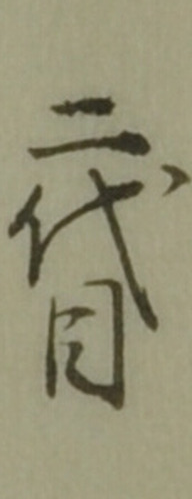二代目
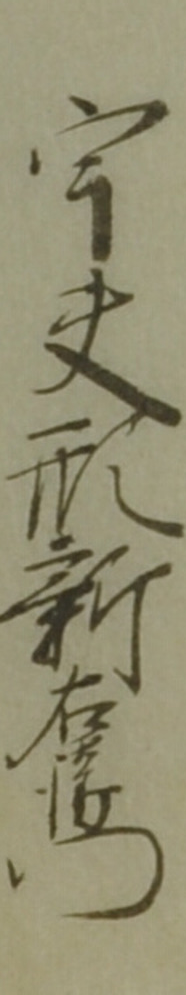宇夫形新右衛門
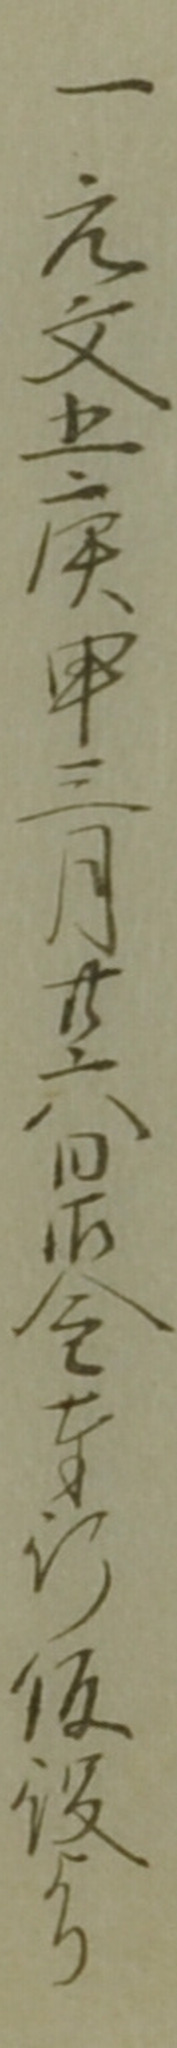一元文五庚申三月廿六日御金奉行仮役より
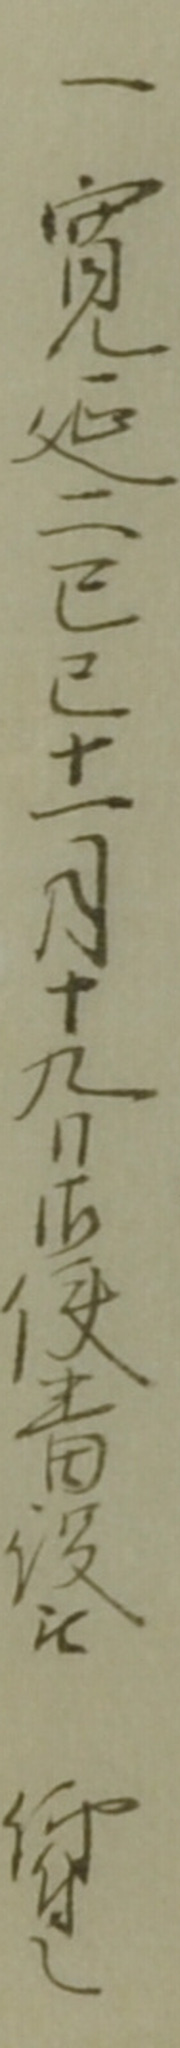一寛延二己巳十一月十九日御使番役被仰付之
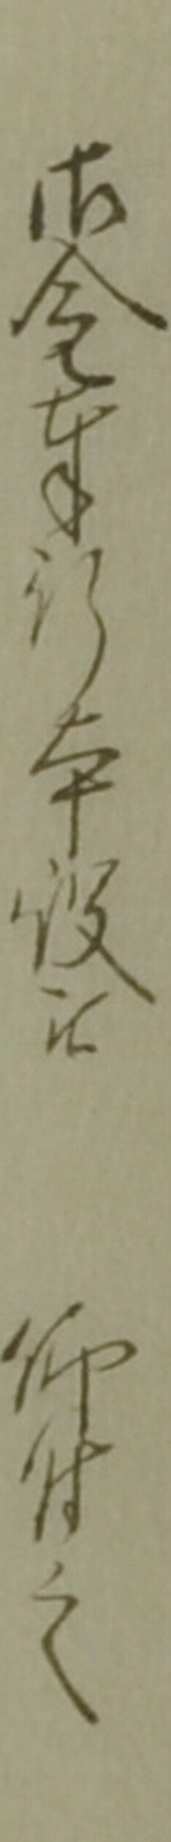御金奉行本役被仰付之

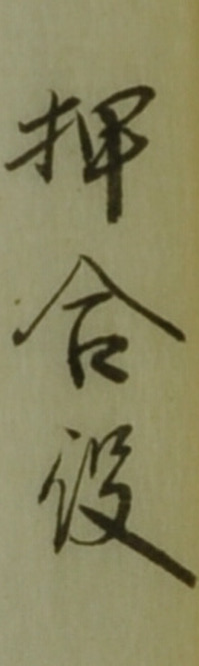押合役
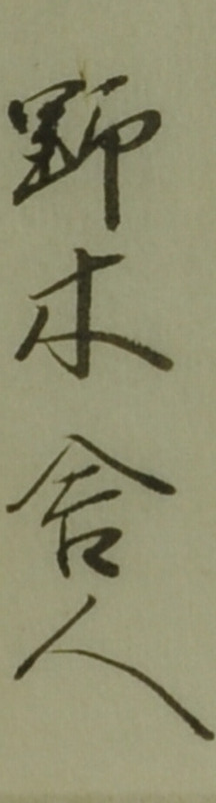野木舎人
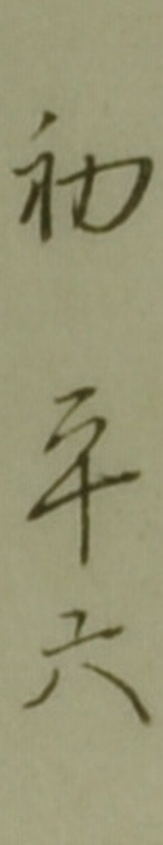初平六
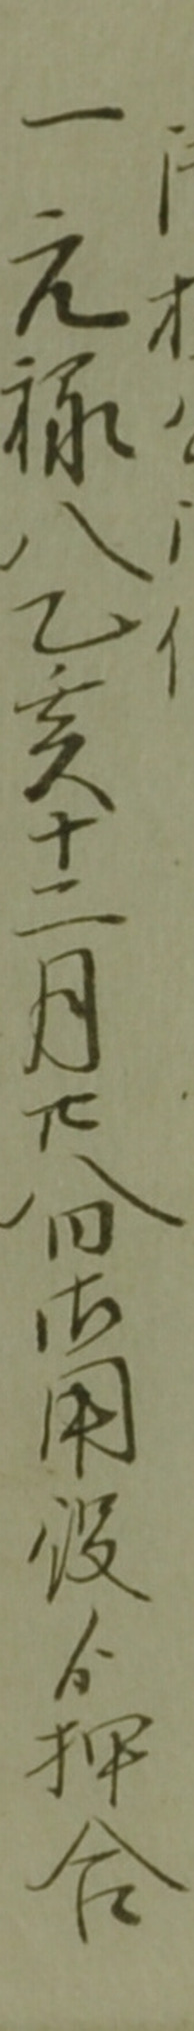一元禄八乙亥十二月廿八日御用役ゟ押合
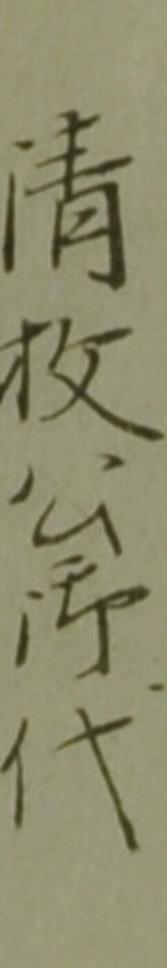清枚公御代
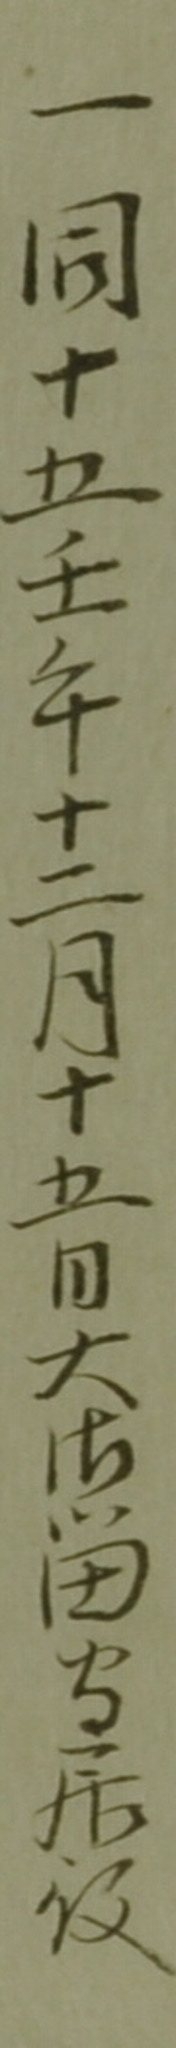一同十五壬午十二月十五日大御留守居役
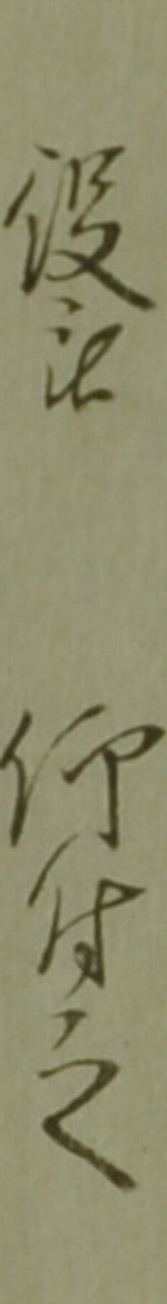役被仰付之
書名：諸御役代々録（七）
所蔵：伊那市立高遠町図書館・合同会社AMANE
